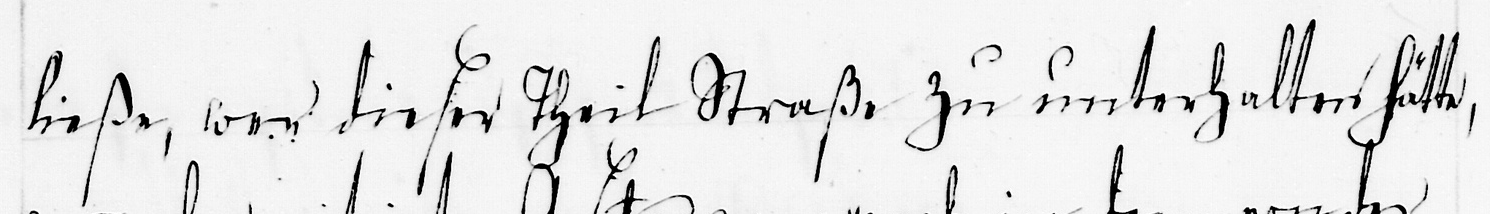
ließe, wer dieser Theil Straße zu unterhalten hätt¬
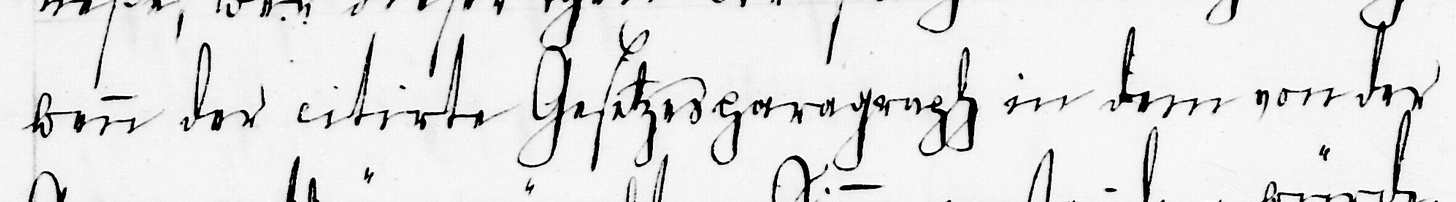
wenn der citirte Gesetzesparagraph in dem von der
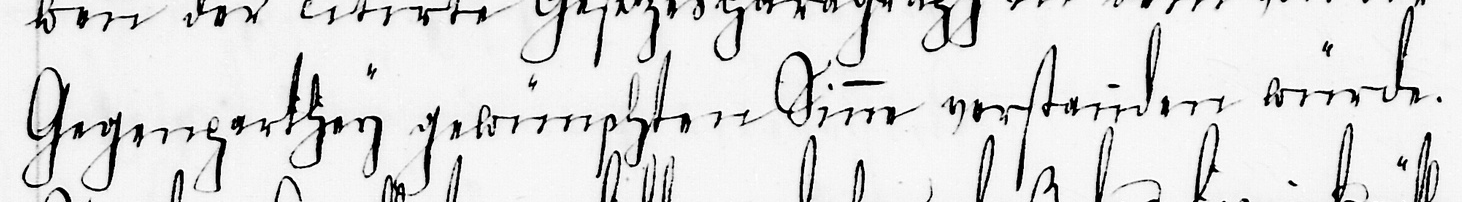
Gegenparthey gewünschten Sinne verstanden würde.
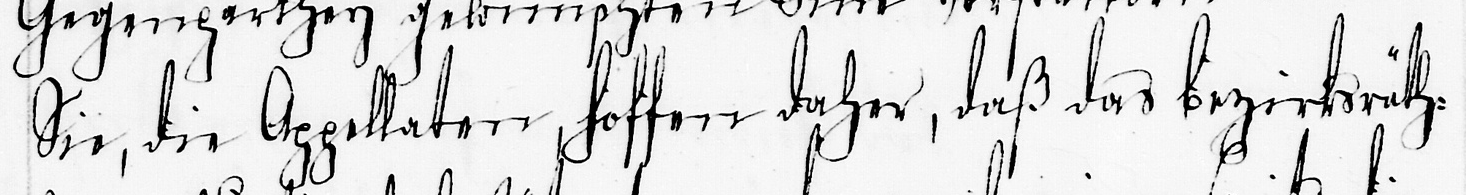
Sie, die Appellaten, hoffen daher, daß bezirksräth¬
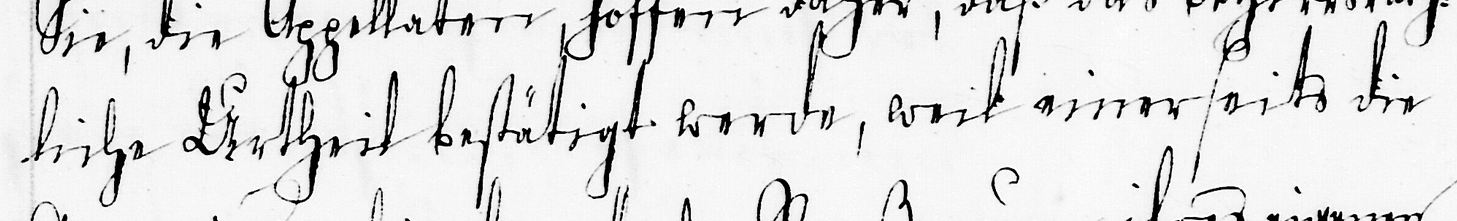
liche Urtheil bestätigt werde, weil einerseits die
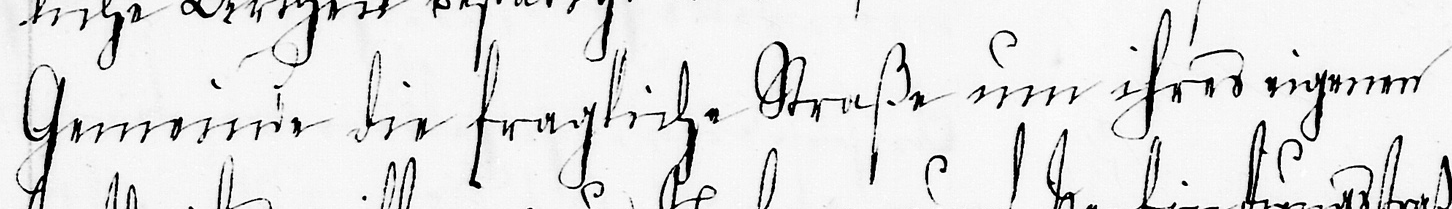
Gemeinde die fragliche Straße um ihres eigenen
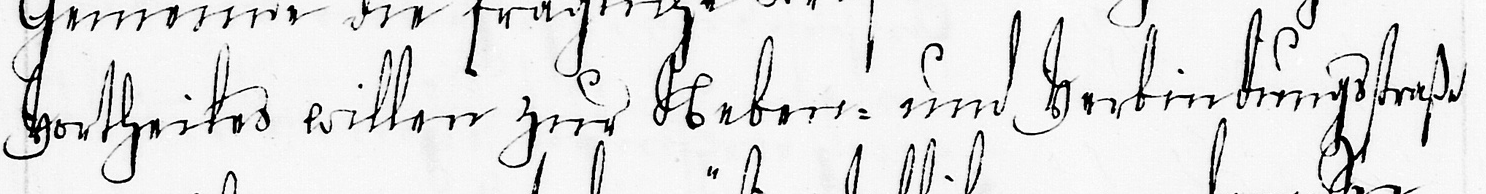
Vortheiles willen zur Neben- und Verbindungsstraße
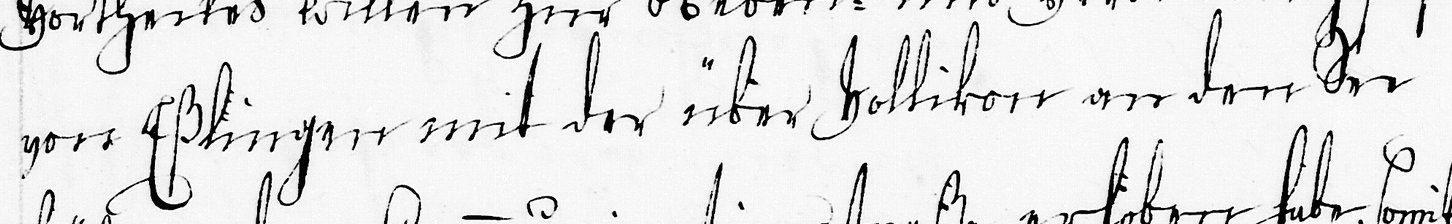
von Eßlingen mit der über Vollikon an den See
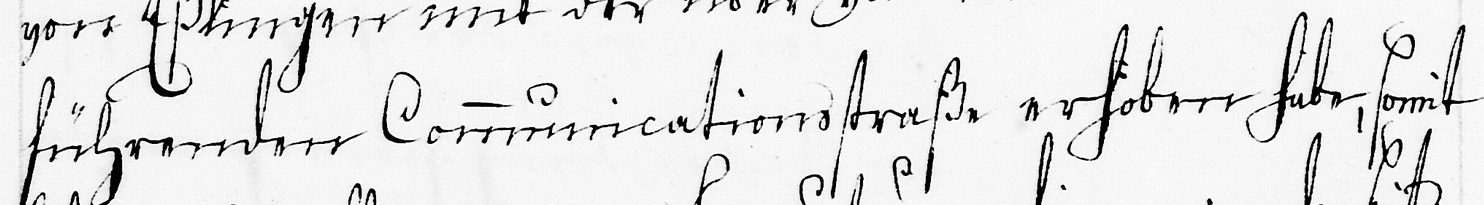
führenden Communicationsstraße erhoben habe, somit
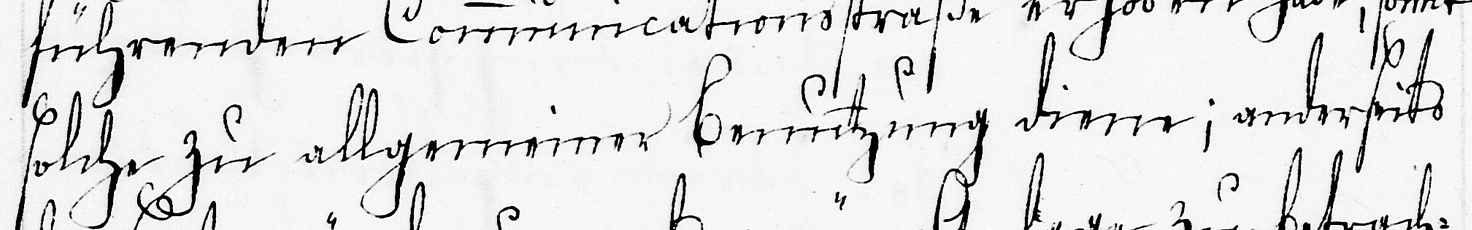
solche zu allgemeiner Benutzung diene; anderseits
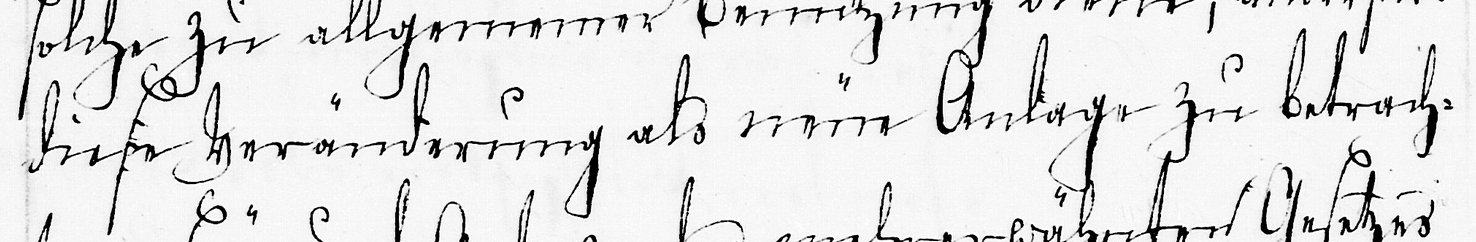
diese Veränderung als neue Anlage zu betrach¬
